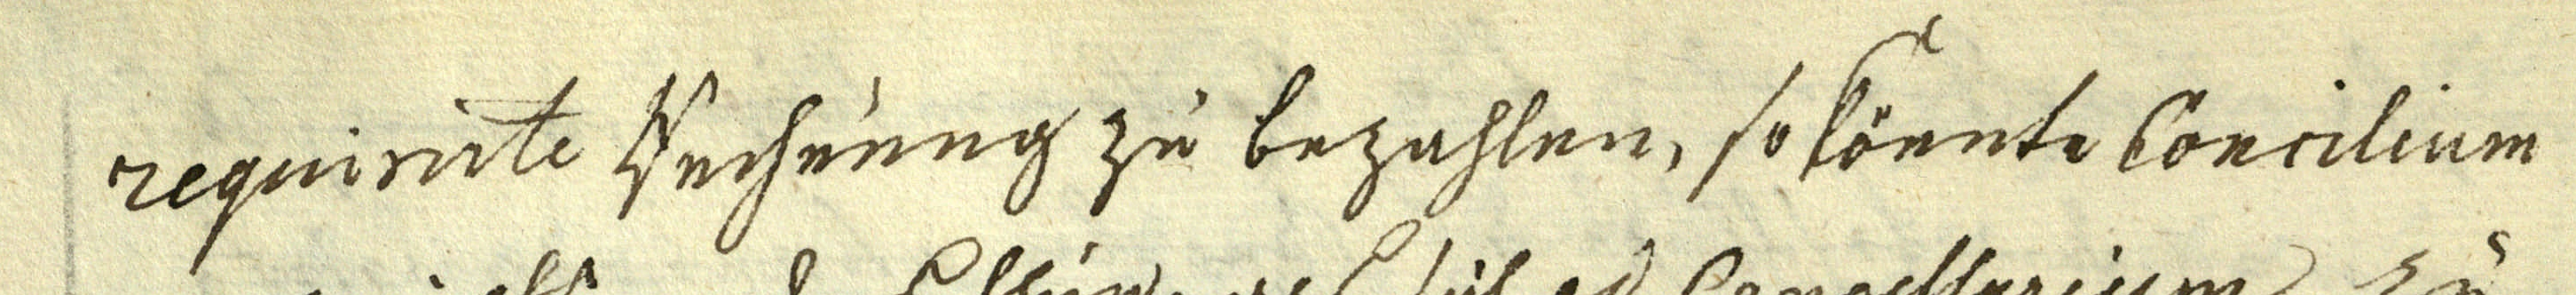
requirirte Rechnung zu bezahlen, so könnte Concilium
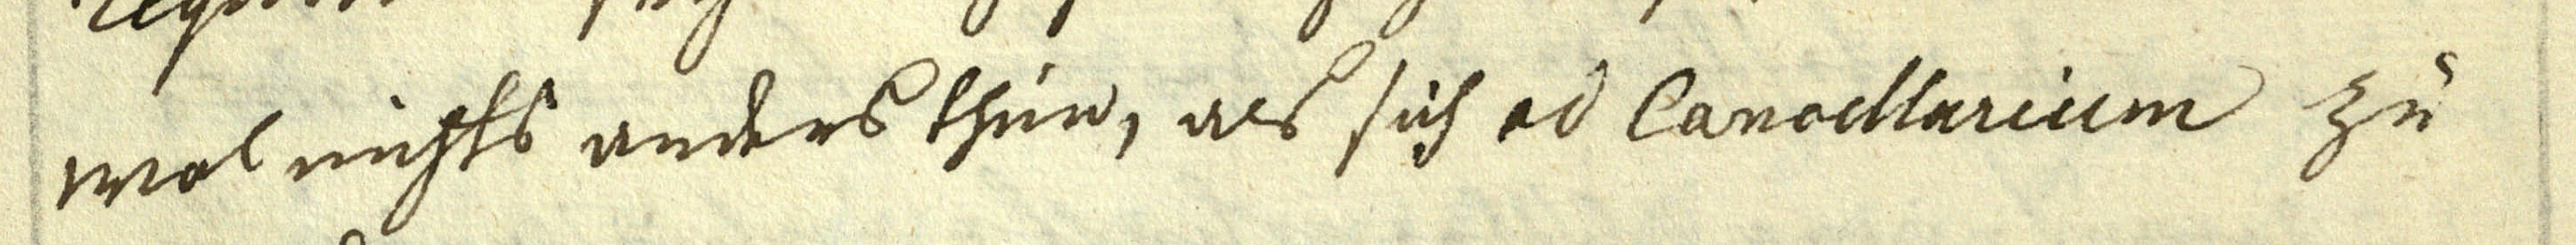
wol nichts anders thun, als sich ad Cancellarium zu
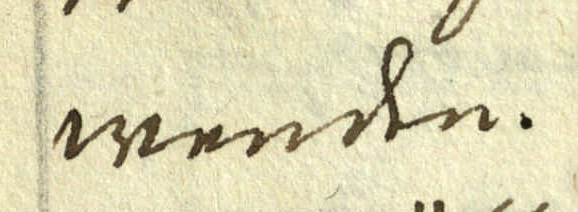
wenden.
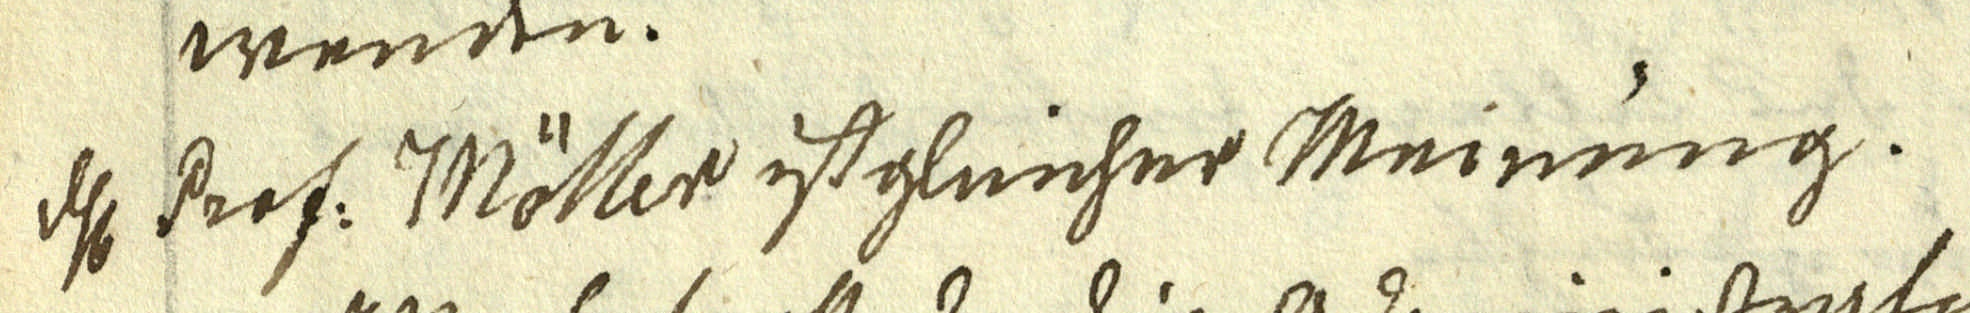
dh Prof. Möller ist gleicher Meinung.
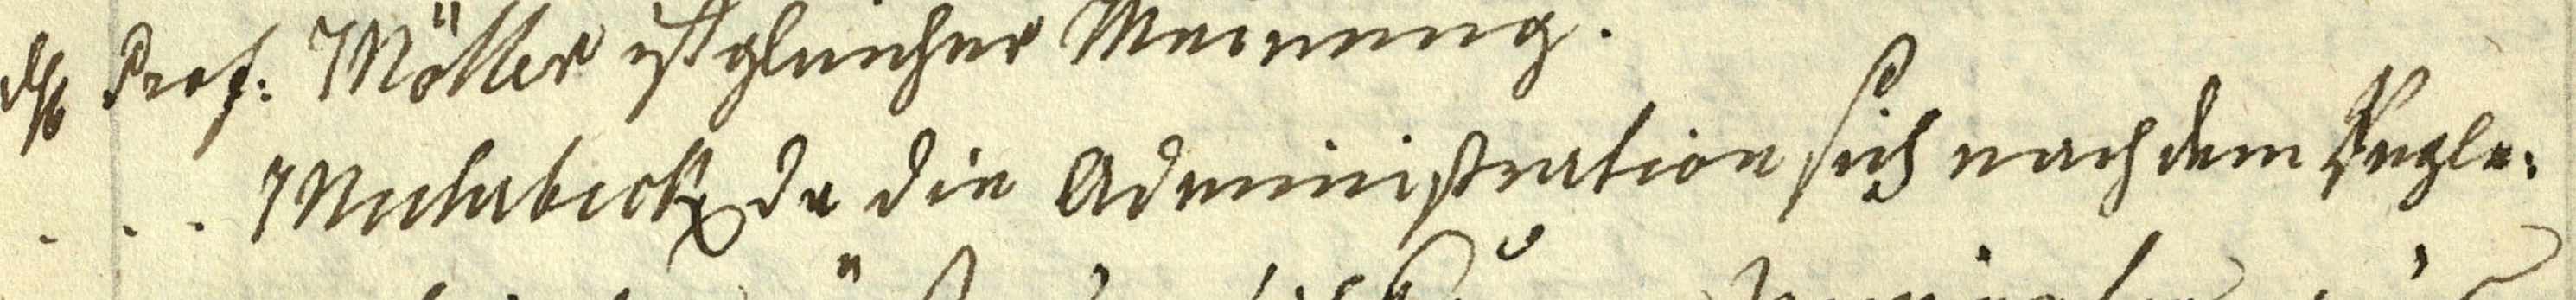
Muhrbeck da die Administration sich nach dem Regle¬
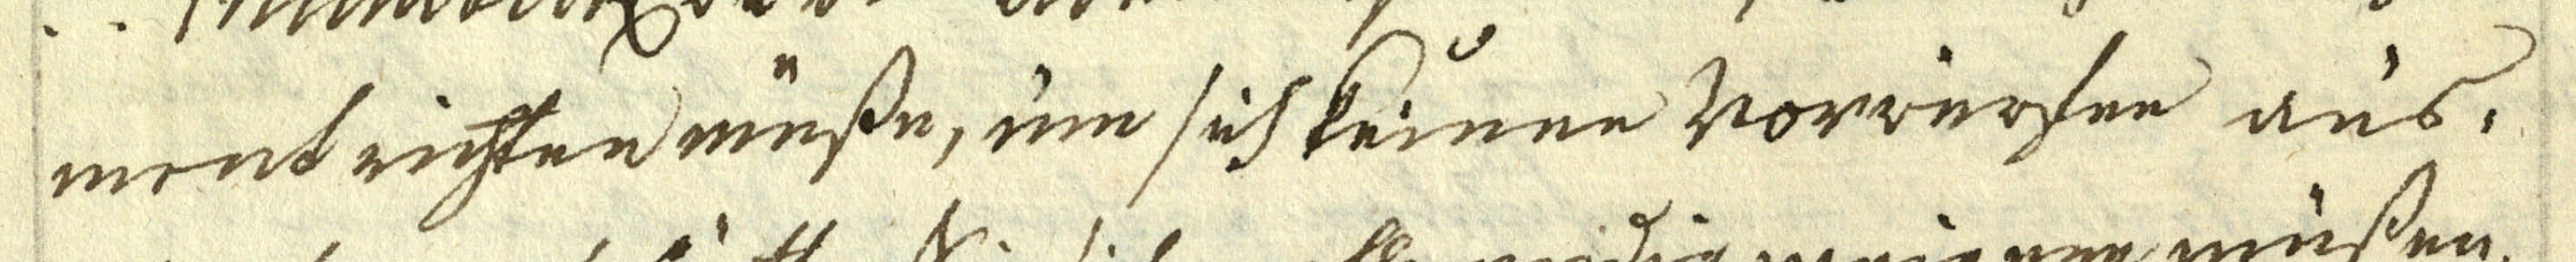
ment richten müße, um sich keinen Vorwürfen aus¬
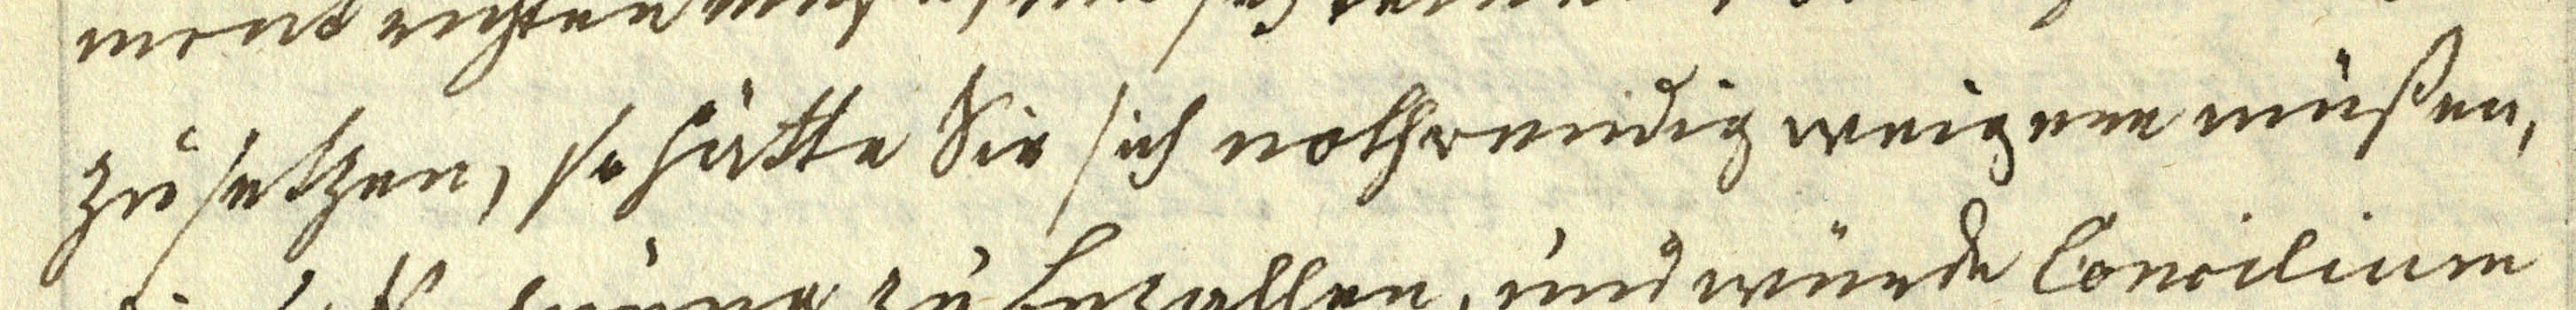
zu setzen, so hätte Sie sich nothwendig weigern müßen,
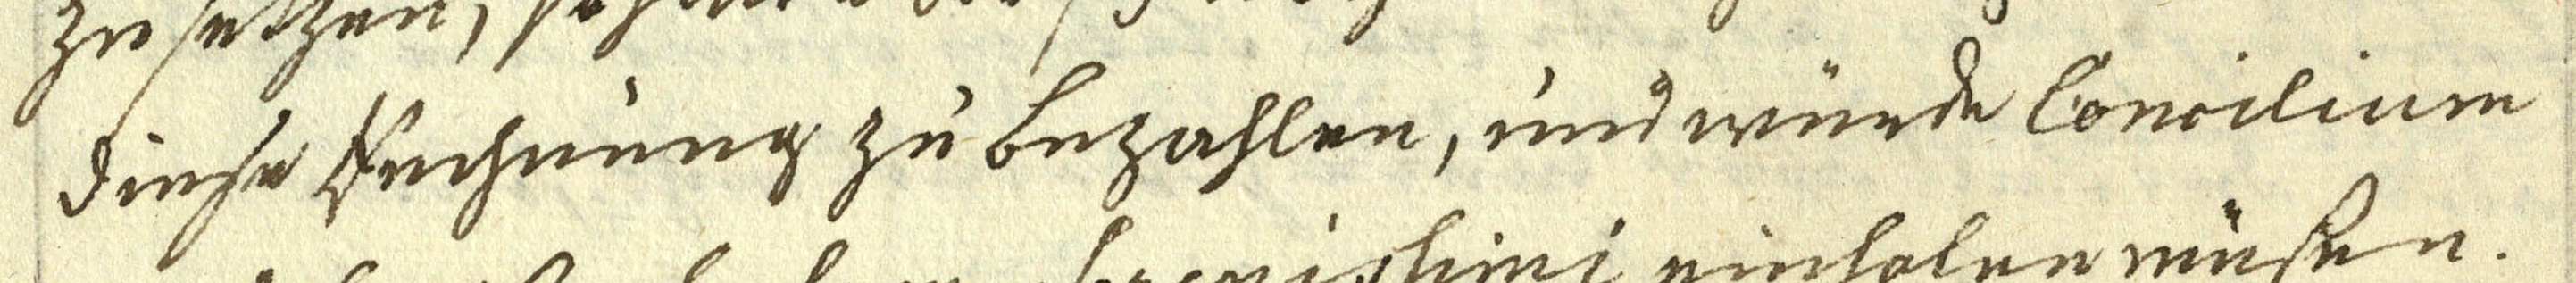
diese Rechnung zu bezahlen, und würde Concilium
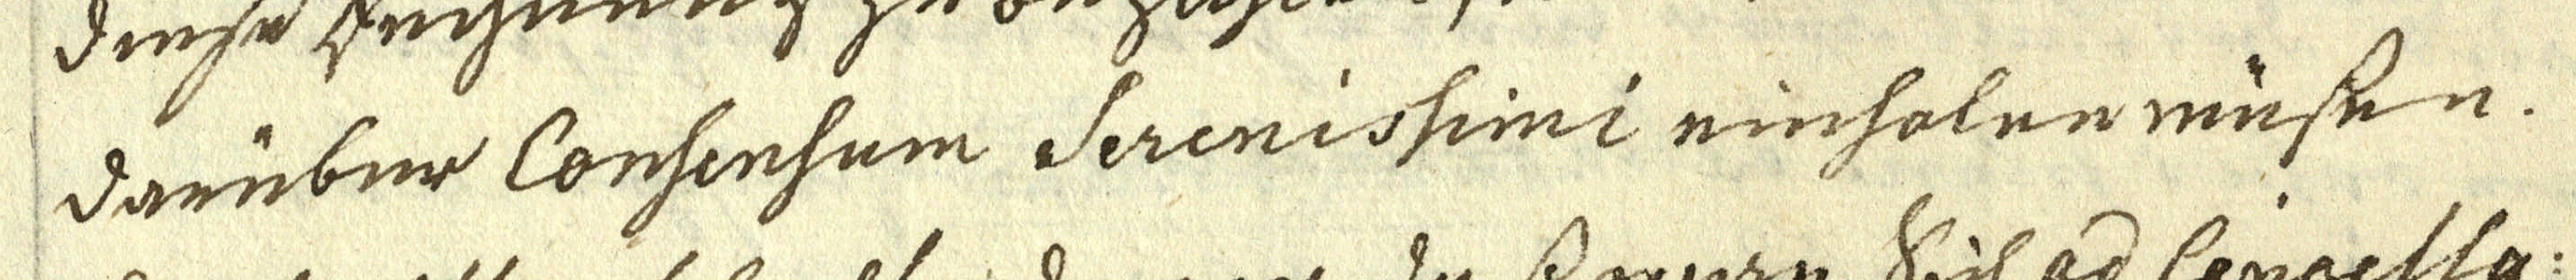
darüber Consensum Serenissimi einholen müßen.
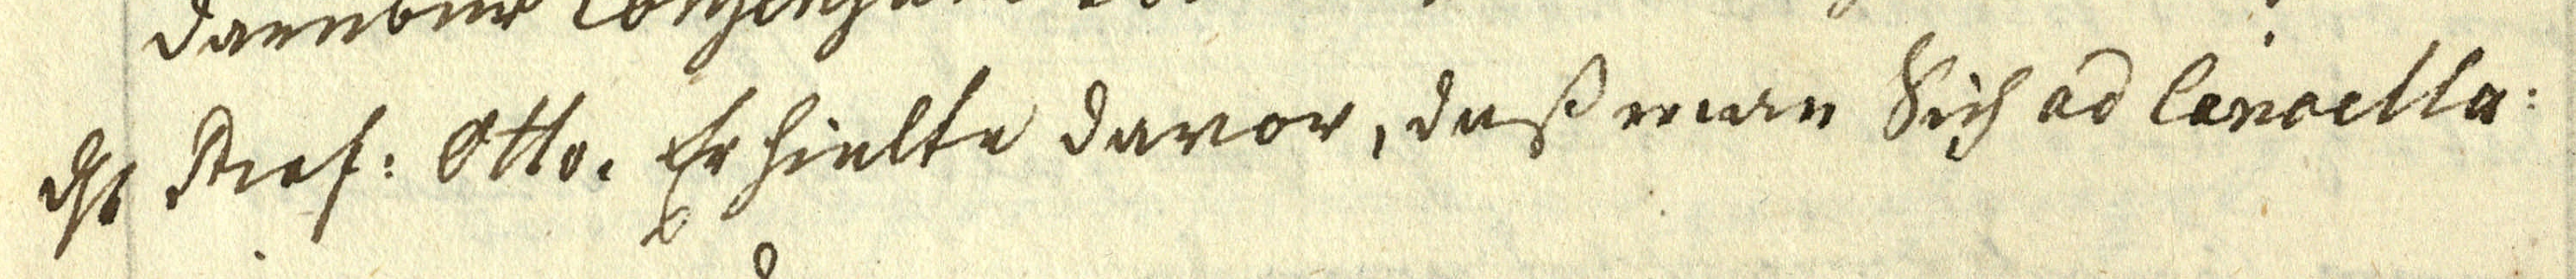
dh Prof. Otto. Er hielte davor, daß man sich ad Cancella¬
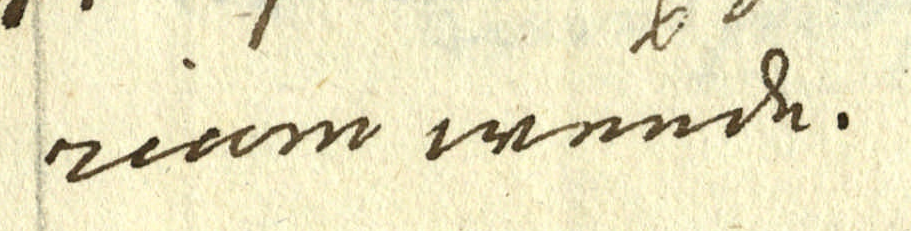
meum wenden.
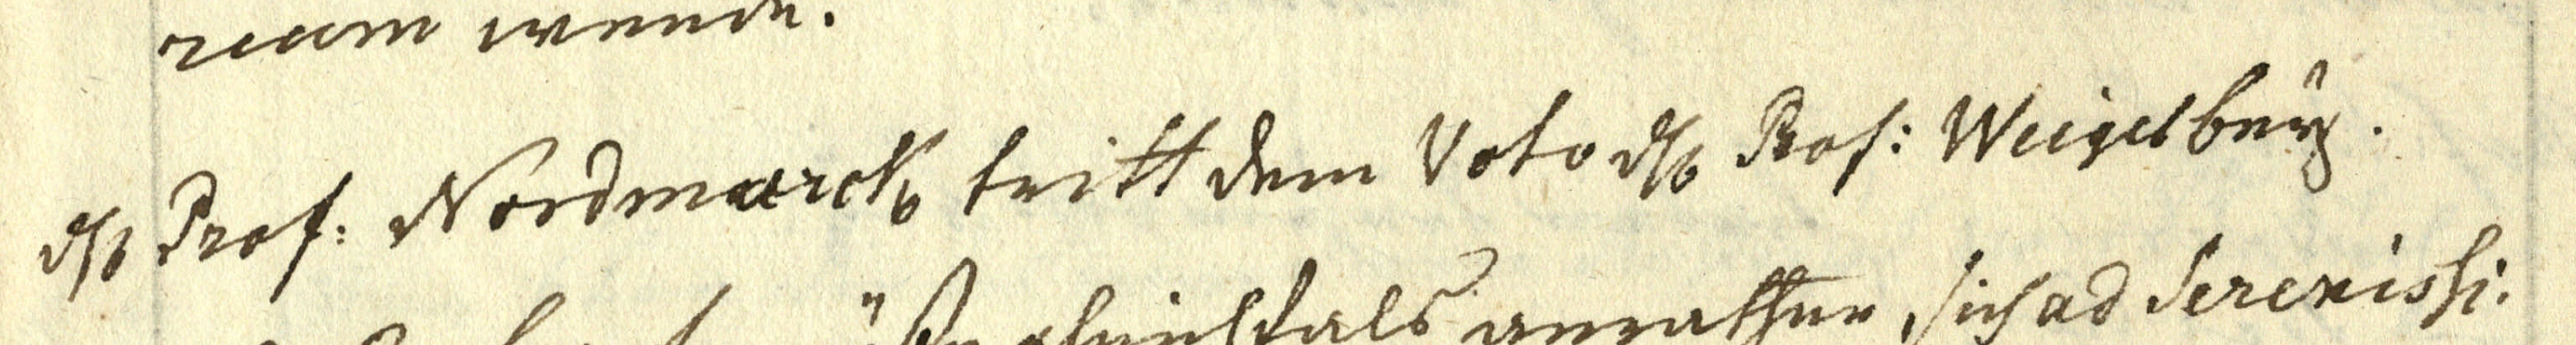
dh Prof. Nordmarck. tritt dem Voto dh Prof. Weigel beÿ.
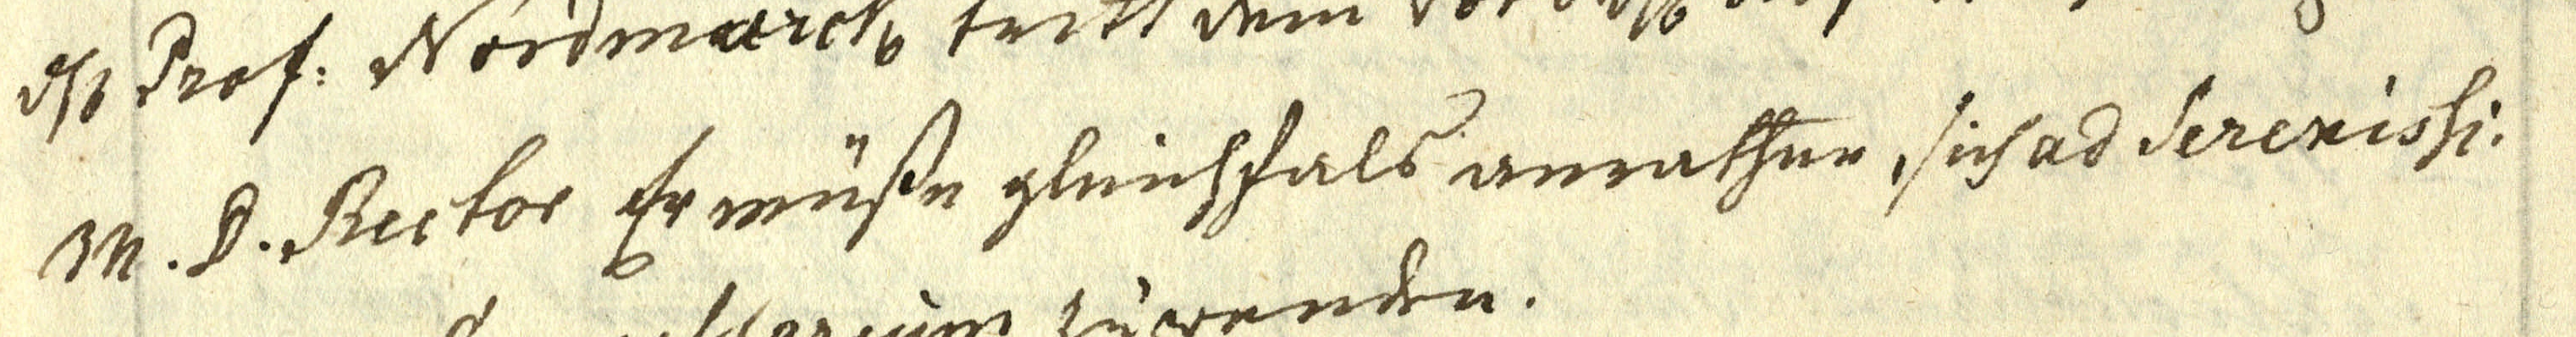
M. D. Rector Er müßte gleichfals anrathen sich ad Sereniss¬
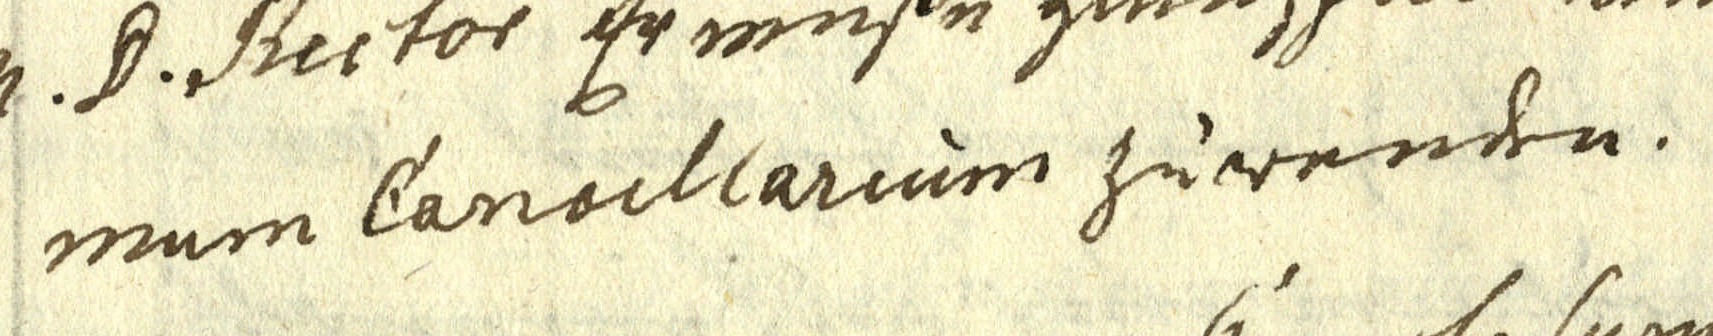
mum Cancellarium zuwenden.
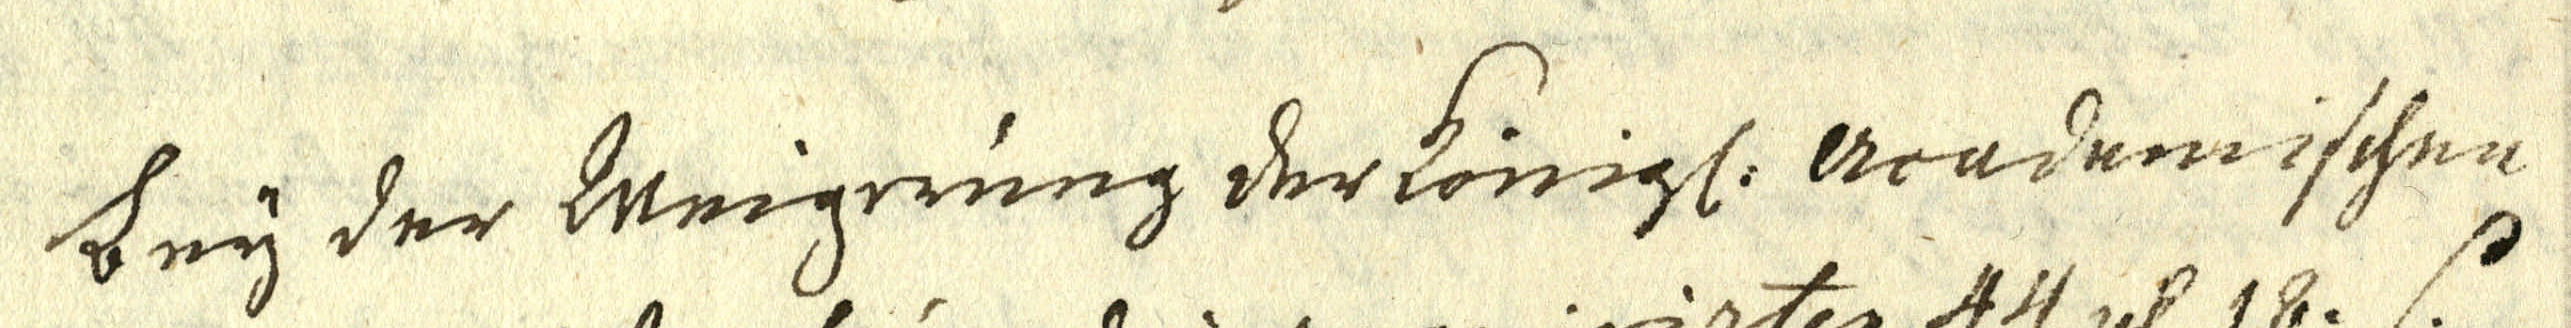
Beÿ der Weigerung der Königl. Academischen
